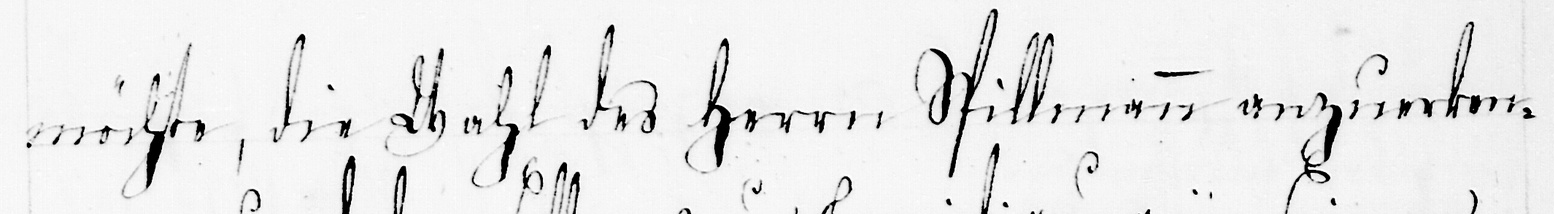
möchte, die Wahl des Herrn Spillmann anzuerken¬
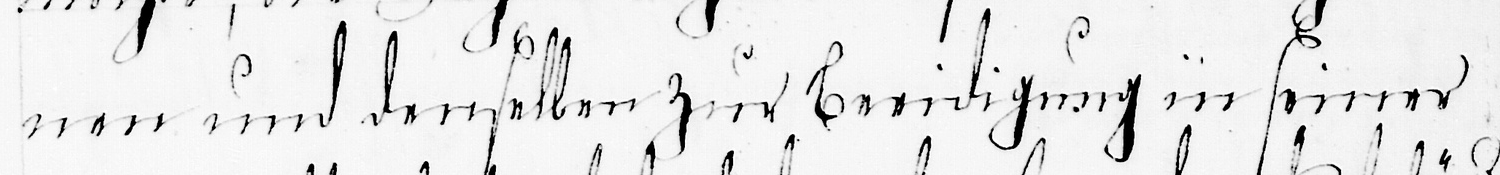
nen und denselben zur Beeidigung in seiner
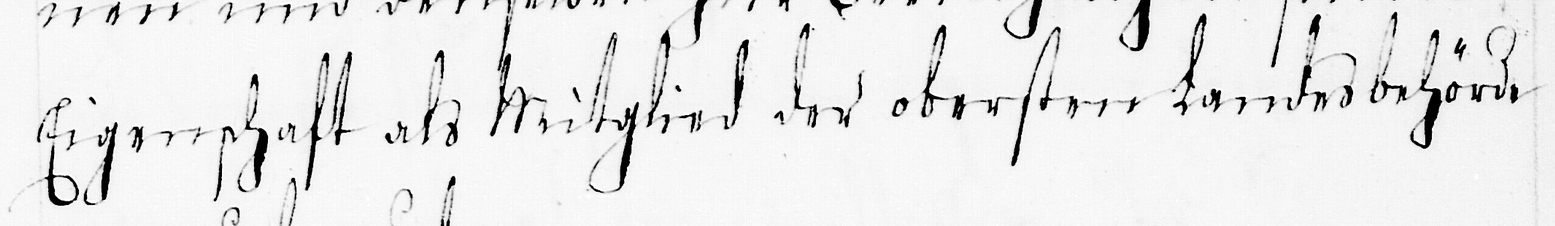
Eigenschaft als Mitglied der obersten Landesbehörde
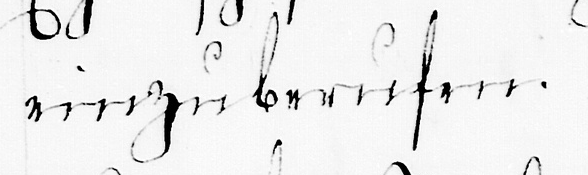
einzuberufen.
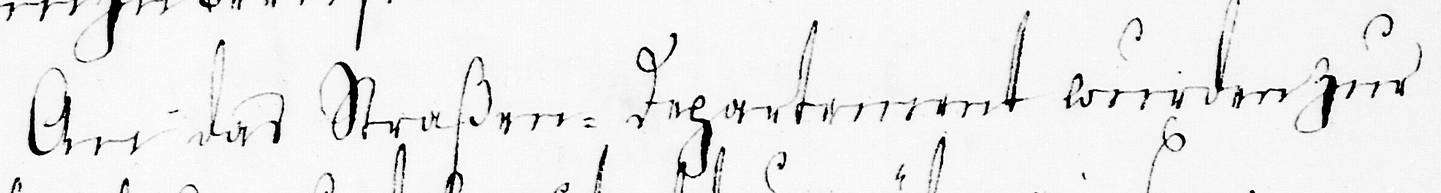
An das Straßen-Departement wurden zur
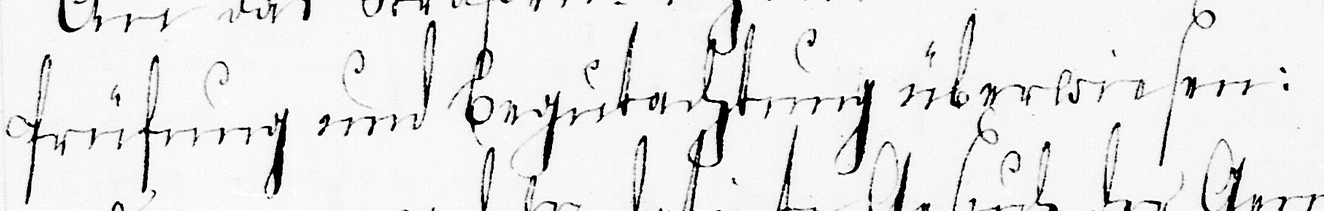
Prüfung und Begutachtung überwiesen:
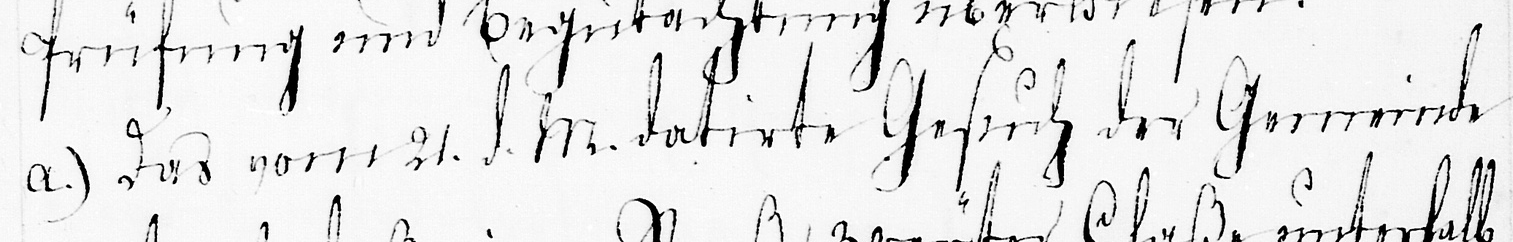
a.) Das vom 21. d. M. datirte Gesuch der Gemeinde
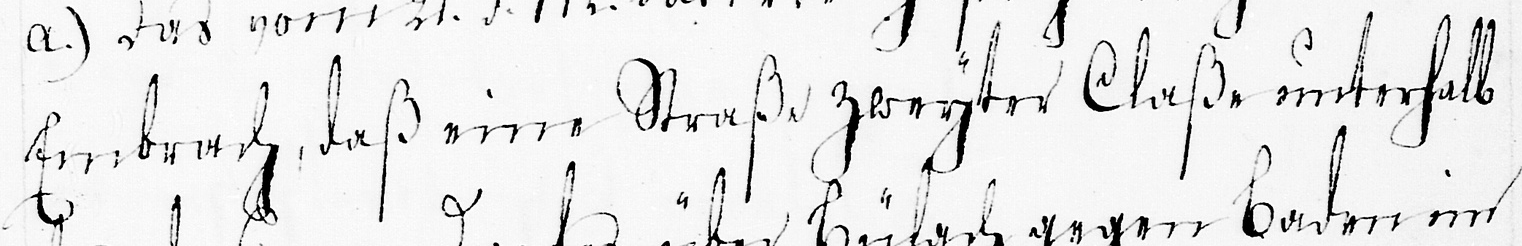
Embrach, daß eine Straße zweyter Claße unterhalb
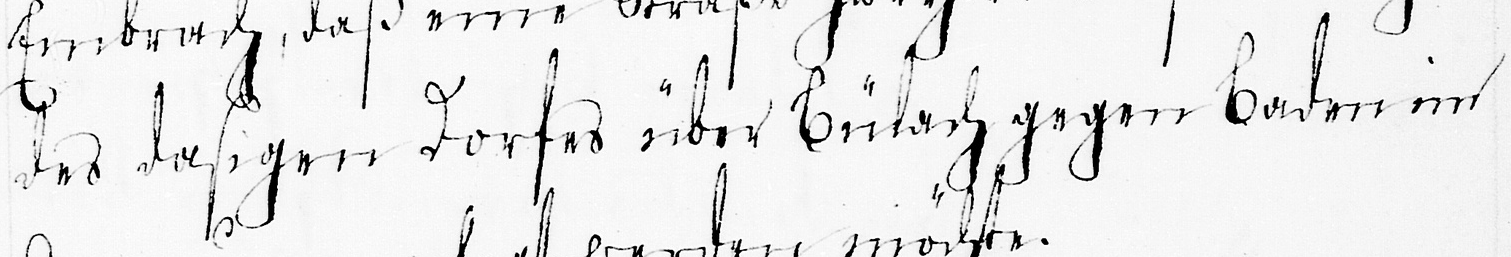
des dasigen Dorfes über Bülach gegen Baden im
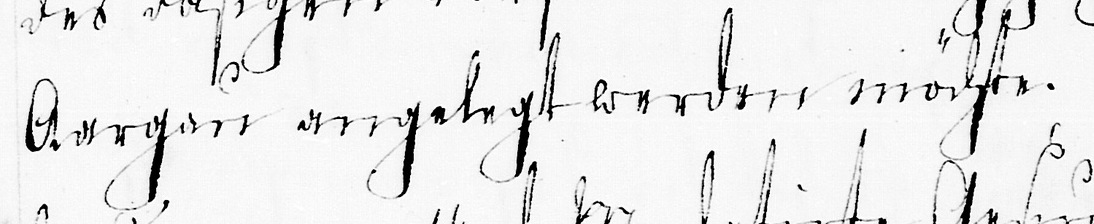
Aargau angelegt werden möchte.
